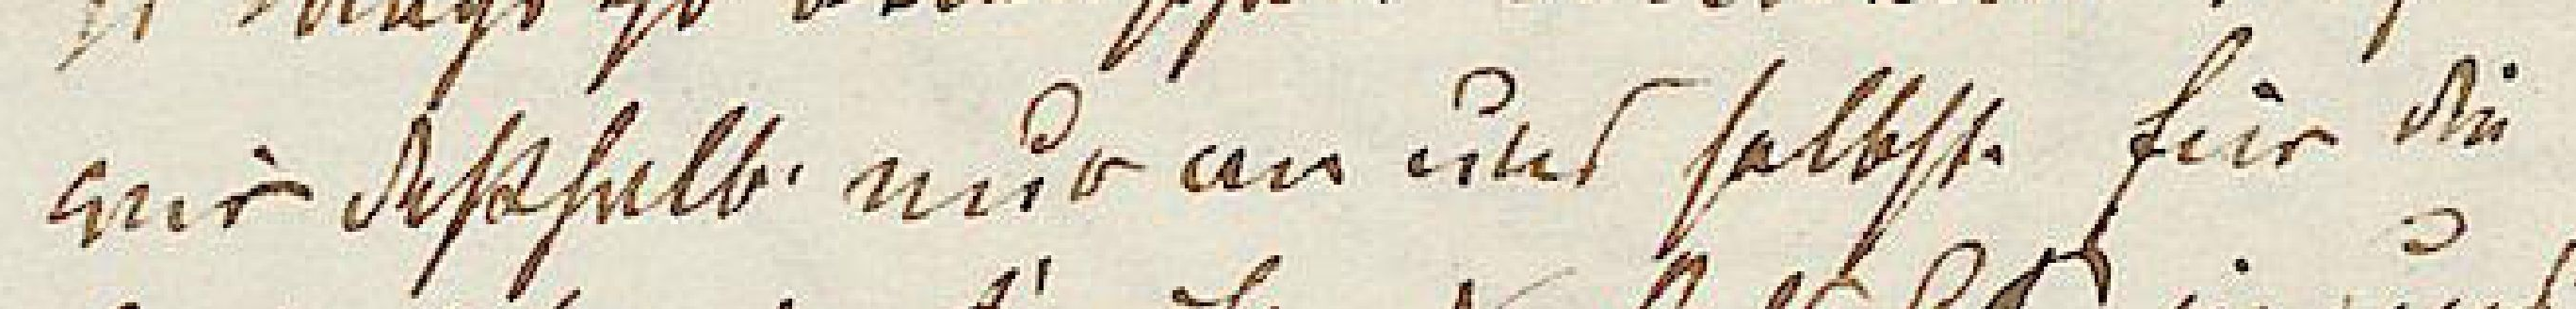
wir deßhalb nur an uns selbst für die
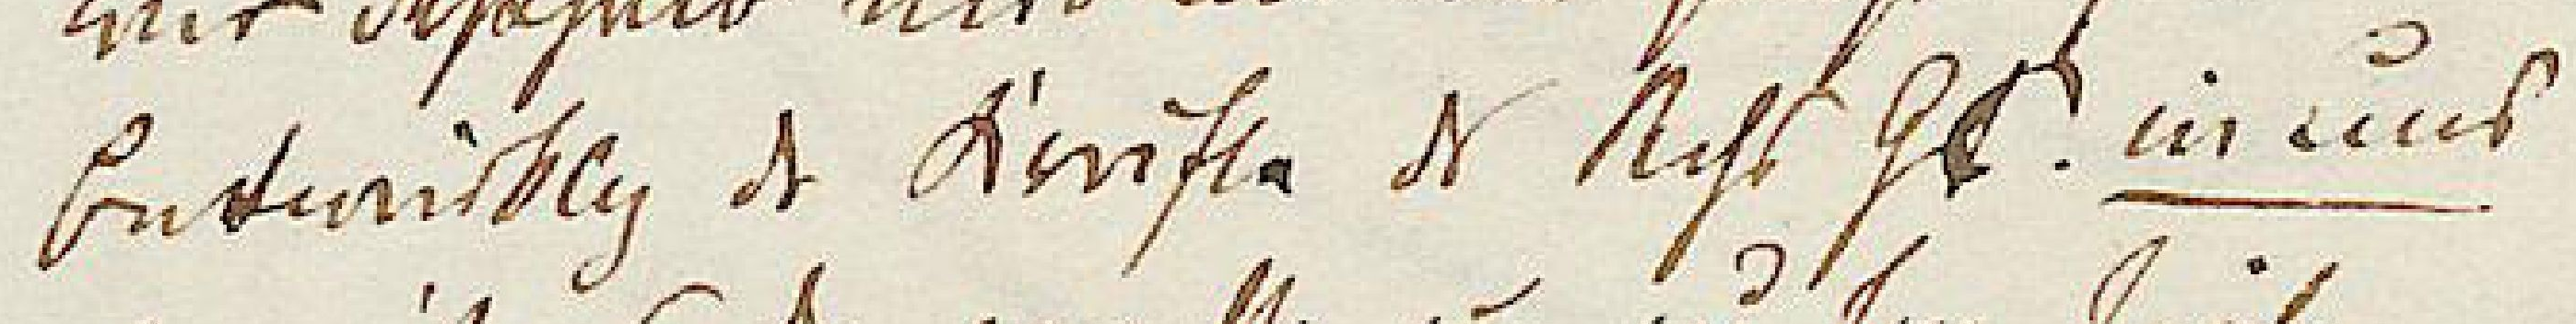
Entwicklg ds. Rchs. Gs. in uns
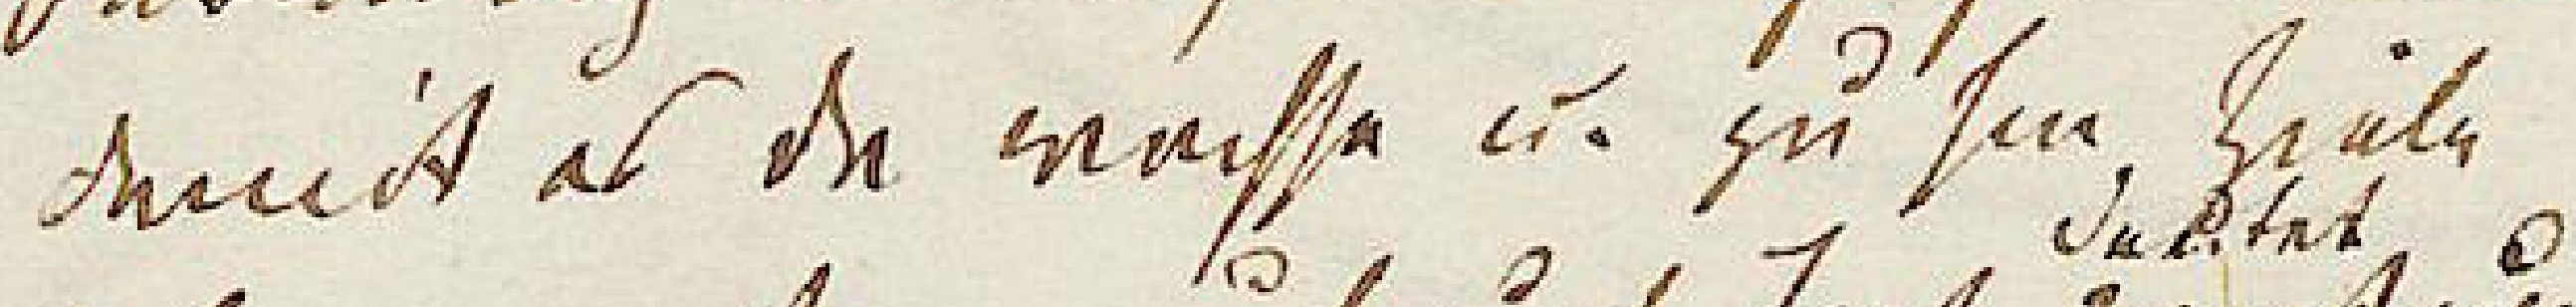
damit es da wachse u zu sm Ziele
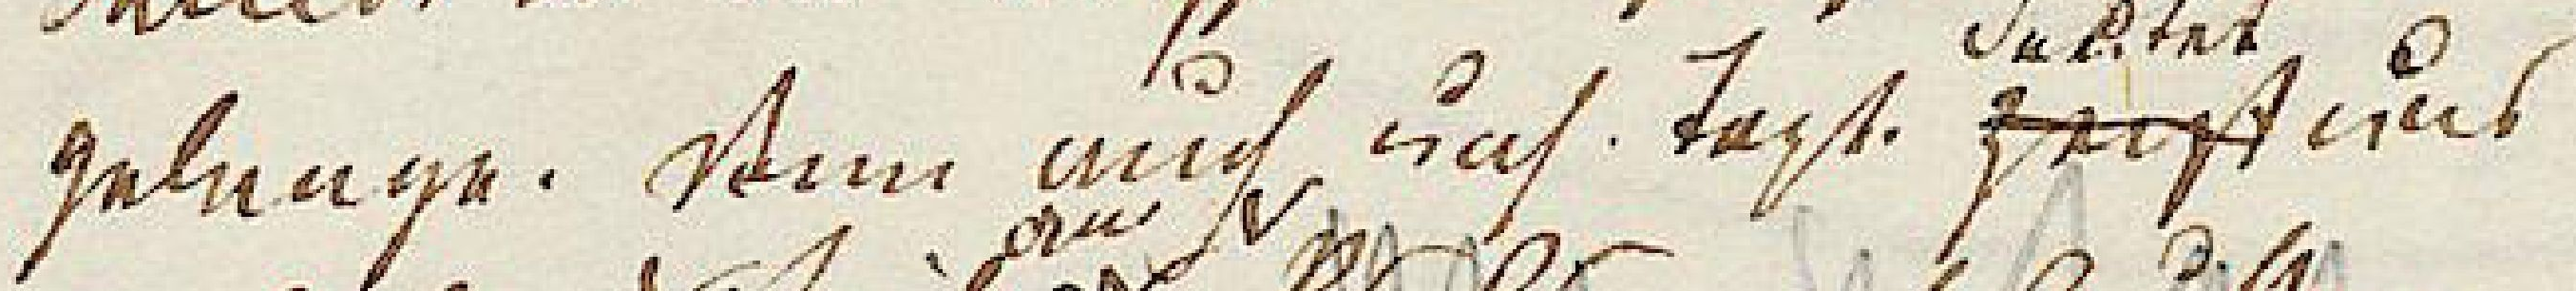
gelange. Denn auch uns. Text zeigt uns
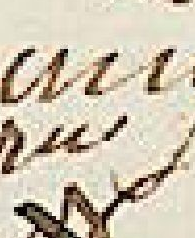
am
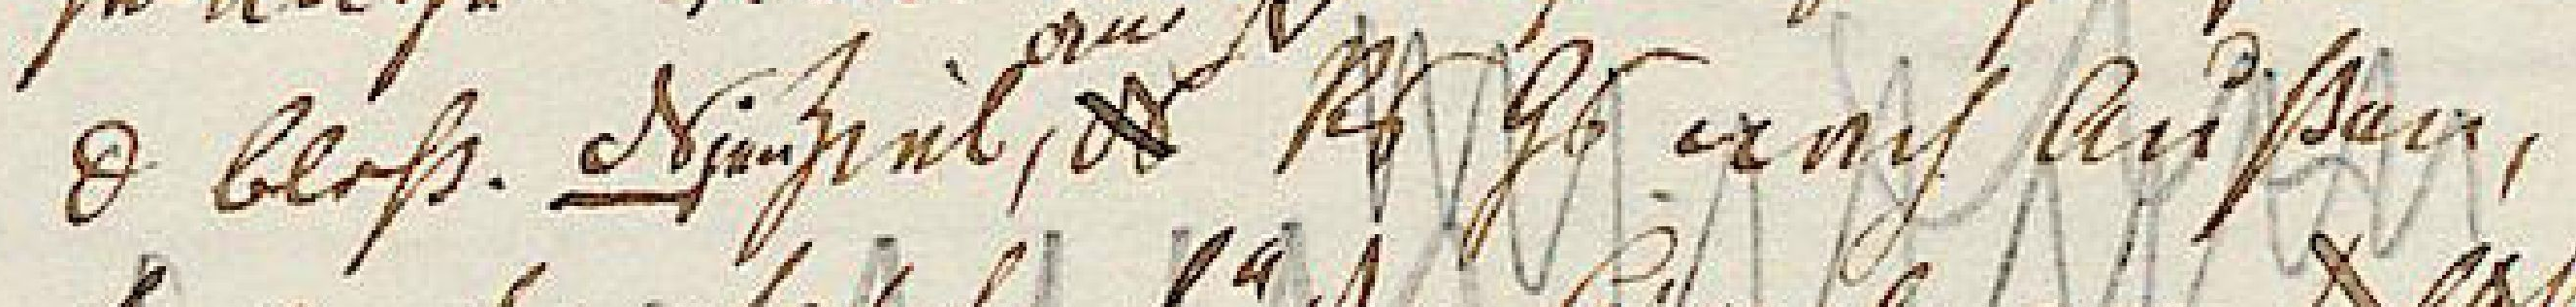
o bloß ds 1ne Ziel, ds Rs Gs nach Außen,
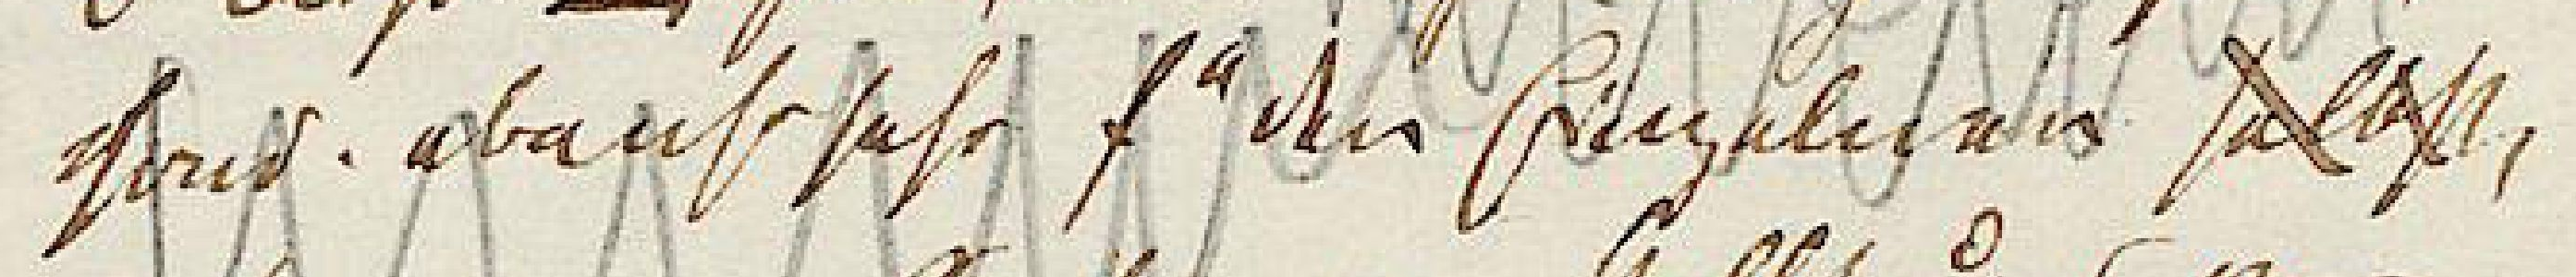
sond. ebenso sehr fü den Einzelnen selbst,
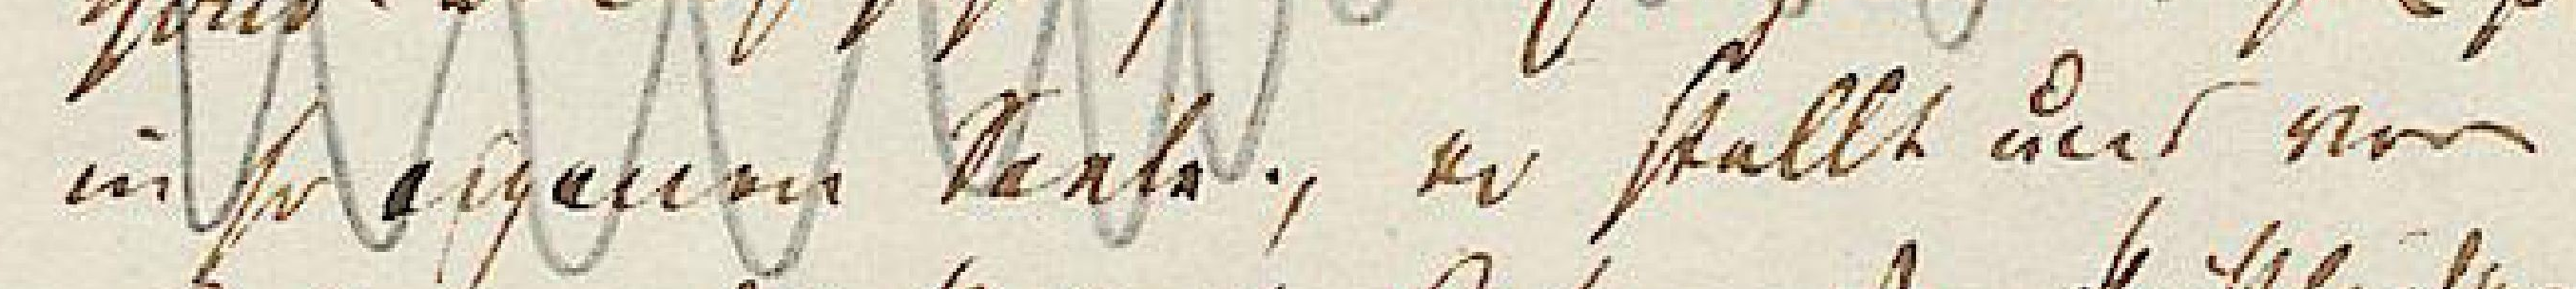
in sr eigenen Seele., er stellt uns vor
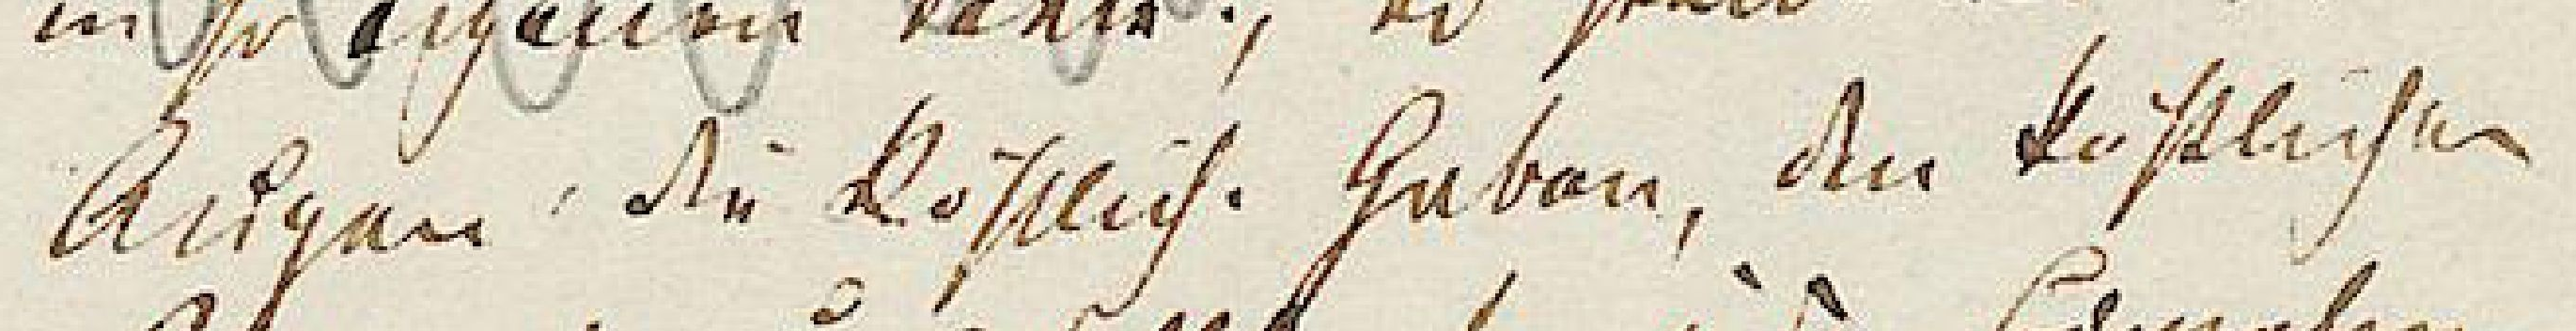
Augen: die köstliche Gaben, den köstlichen
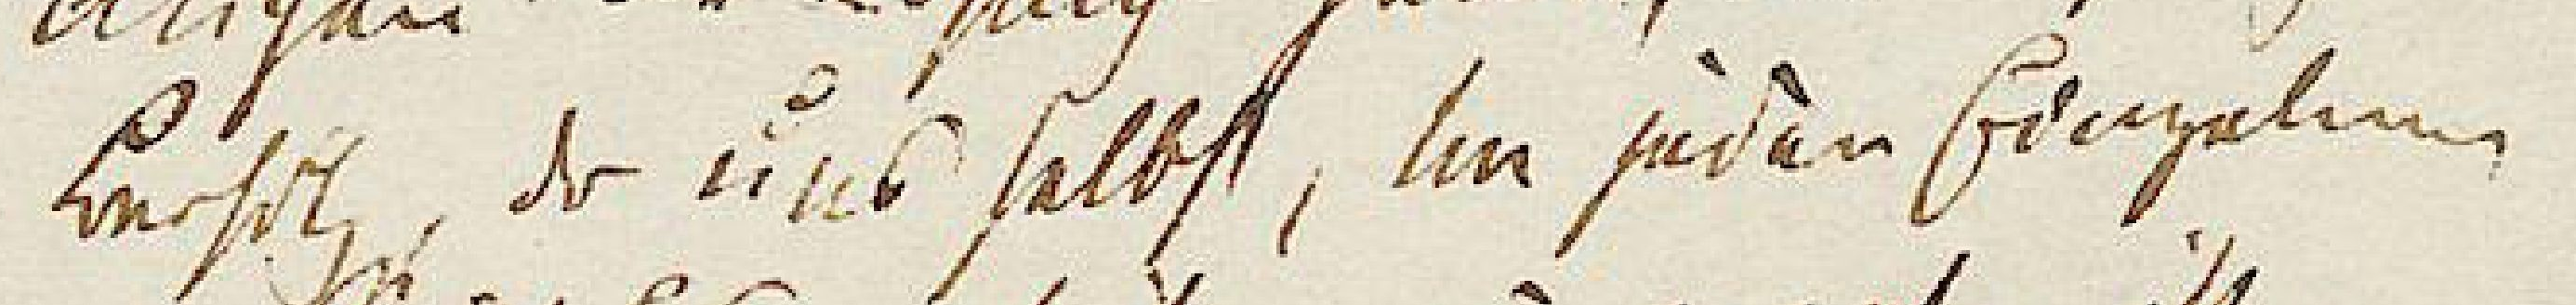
Besitz, der uns selbst, 1m jeden Einzelnen,
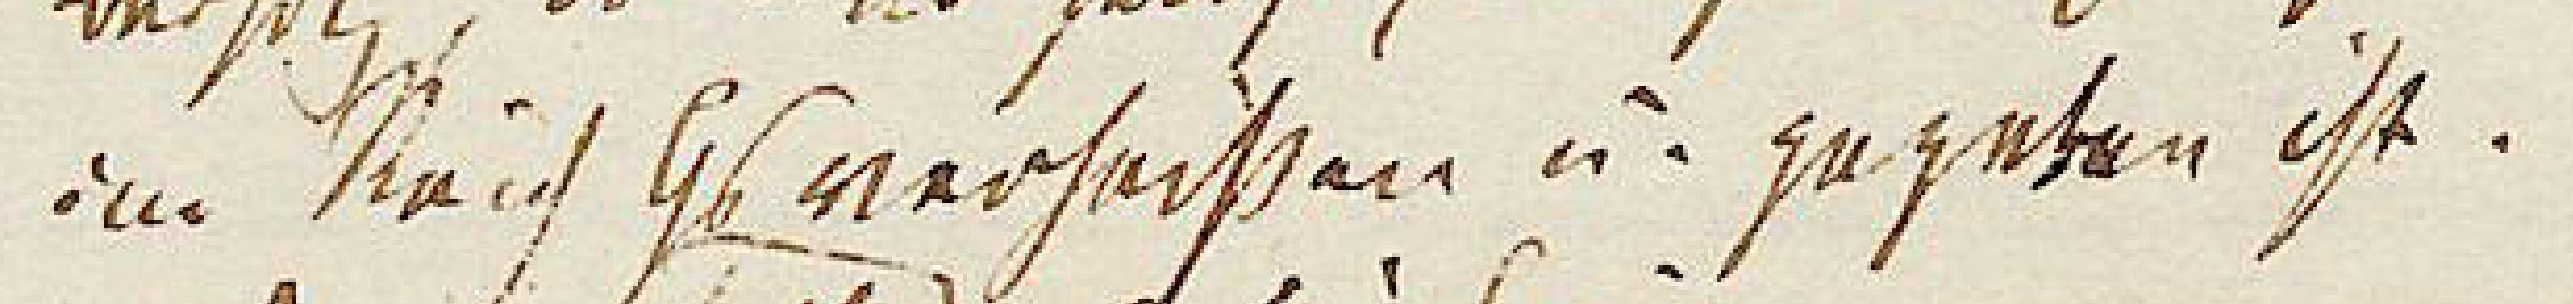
im Reich Gs. verheißen u. gegeben ist.
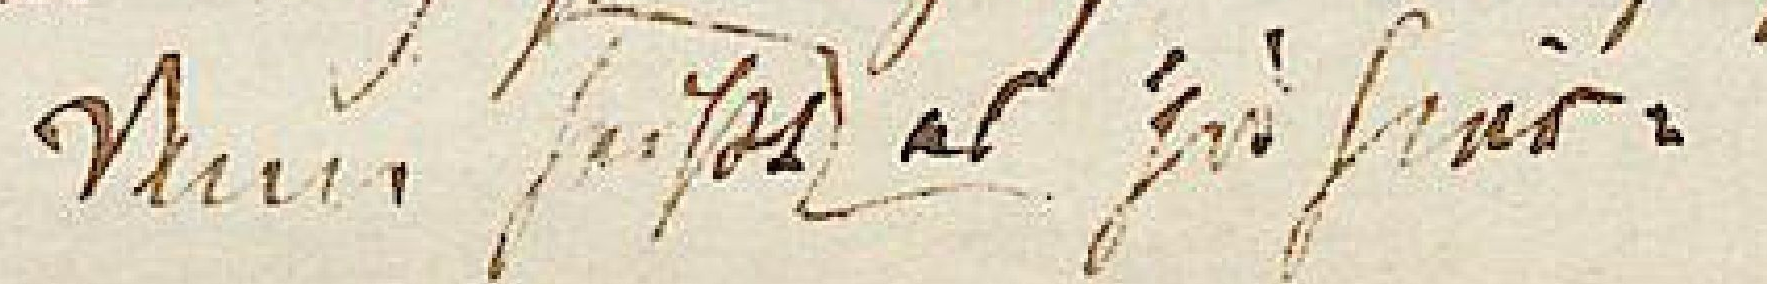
Denn heißt es ja hier:
